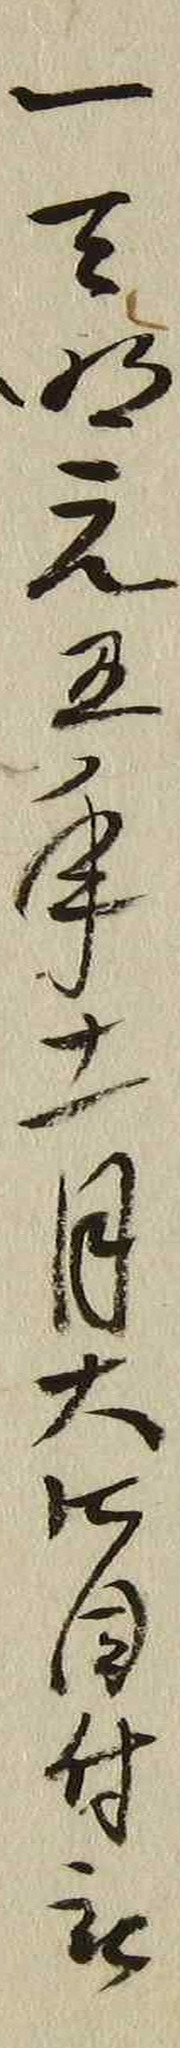一天明元丑年十一月大御目付被
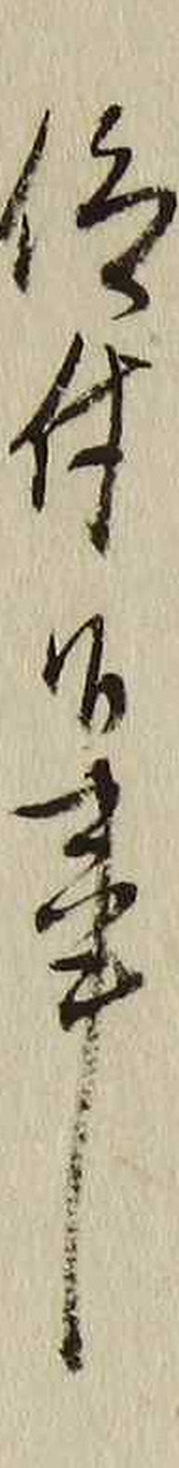仰付候事
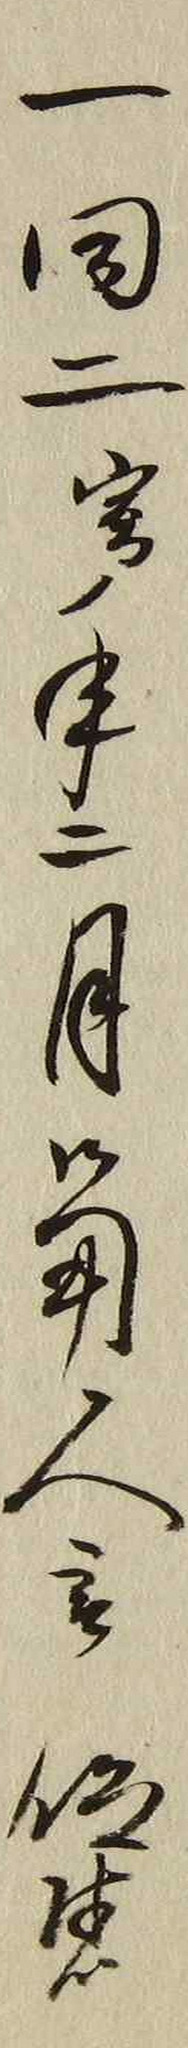一同二寅年二月御用人被仰付候
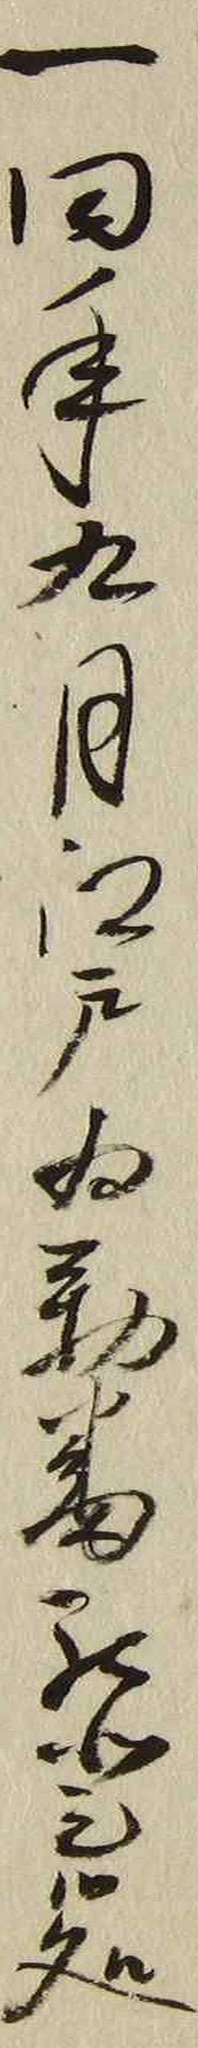一同年九月江戸為勤番罷登候処
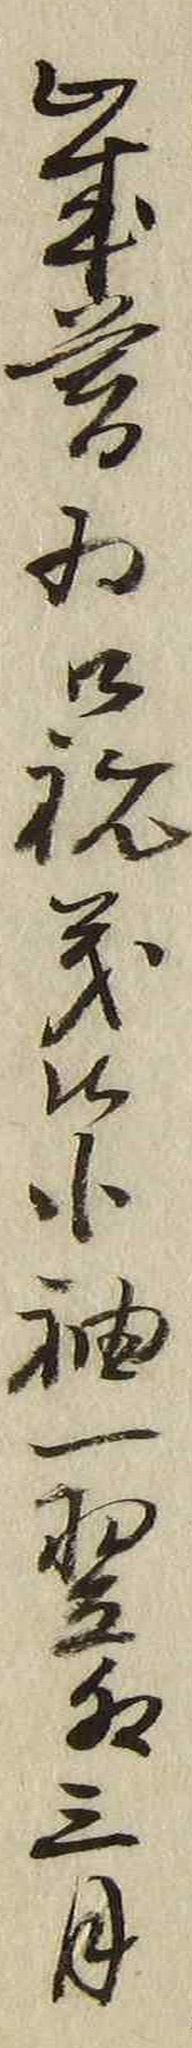歳暮為御祝義御小袖一翌卯三月

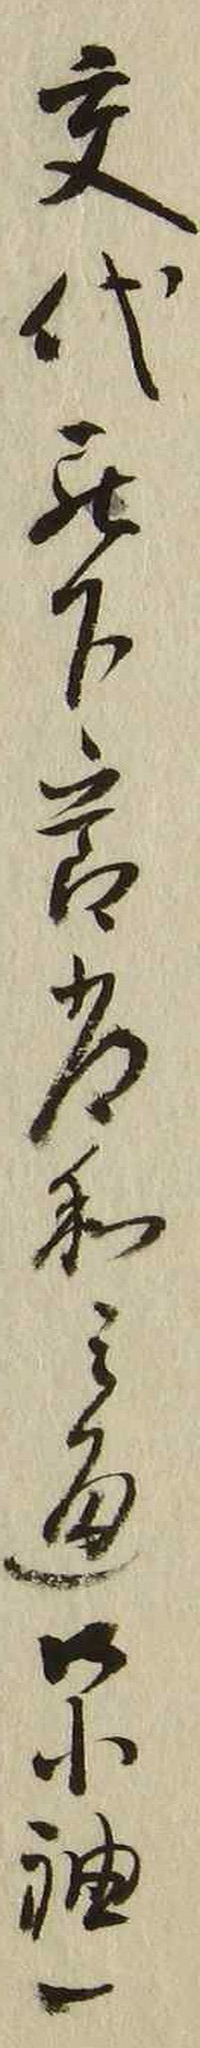交代罷下候節常和之通御小袖一
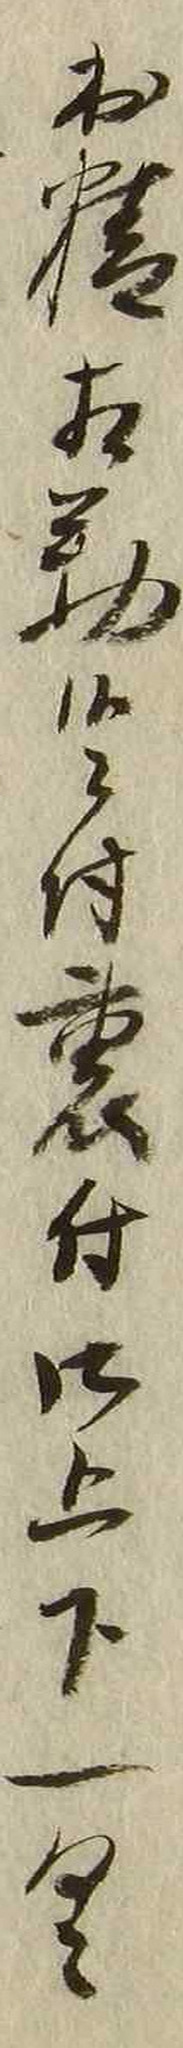出精相勤候ニ付裏付御上下一具
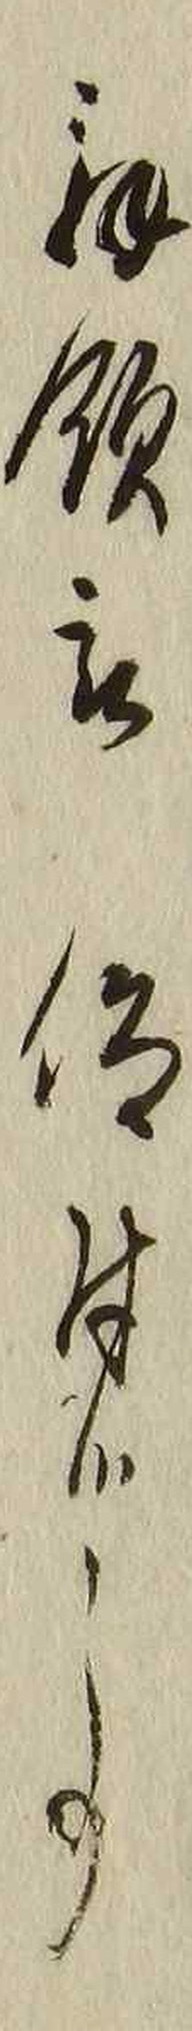拝領被仰付候事
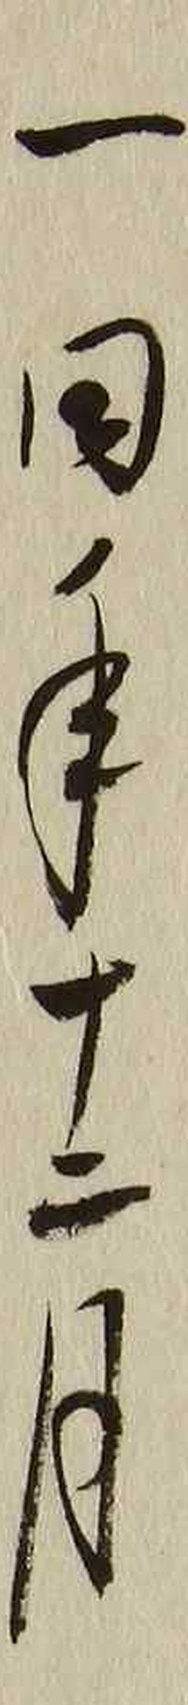一同年十二月
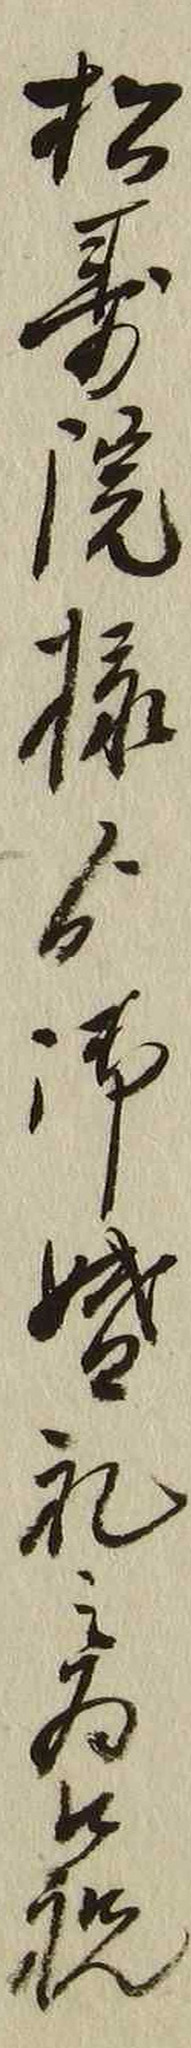松寿院様ゟ御婚礼之為御祝
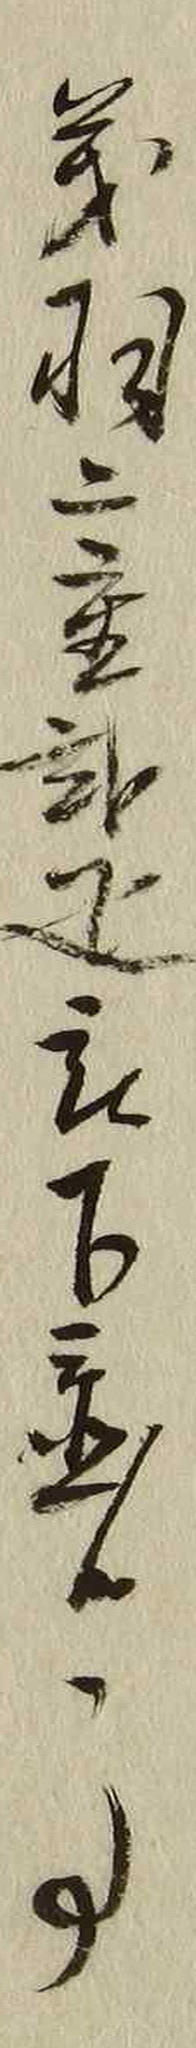義羽二重弐疋被下置候事
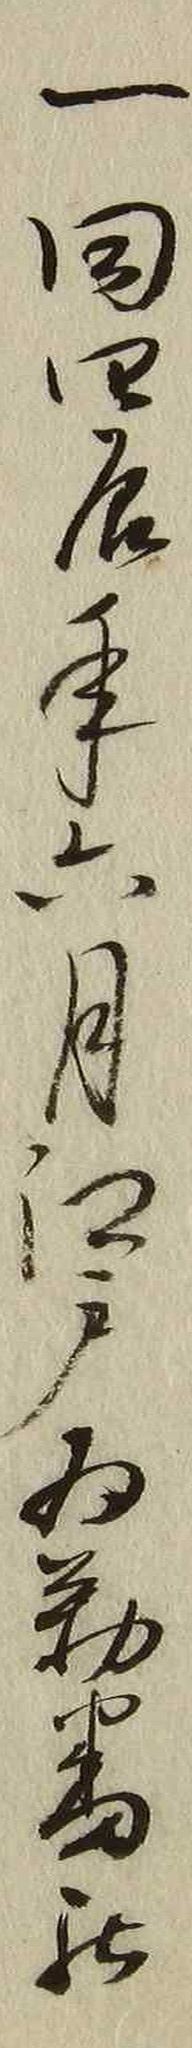一同四辰年六月江戸為勤番罷
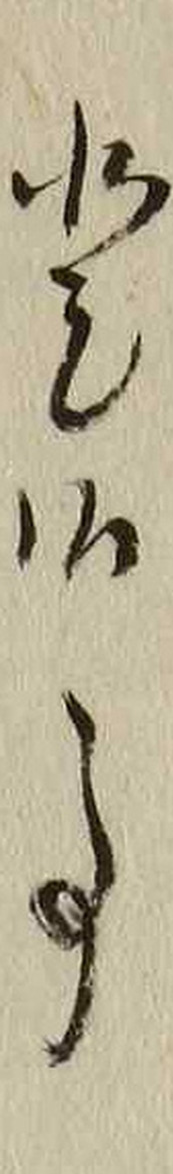登候事
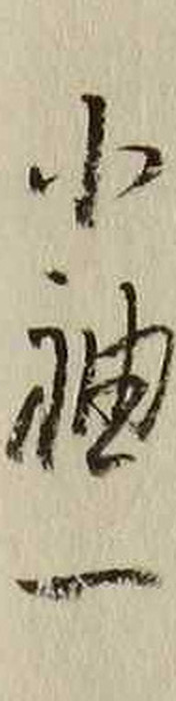小袖一
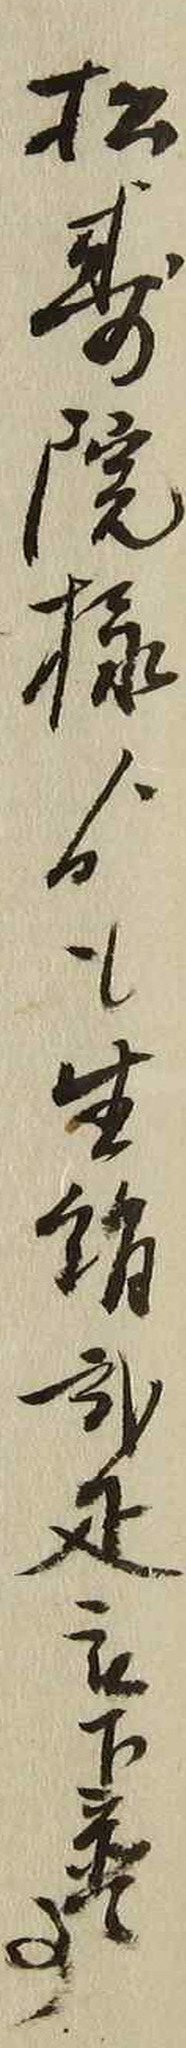松寿院様ゟも生絹弐疋被下置候事
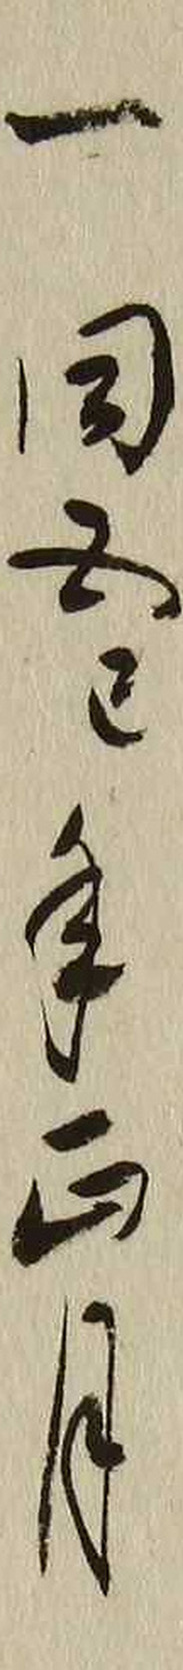一同五巳年正月
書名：諸士系譜　巻之351　す之部1
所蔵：会津若松市立会津図書館
